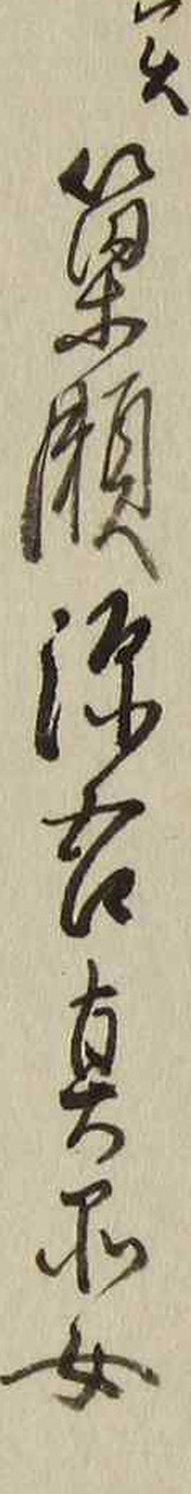実簗瀬源吾真品女
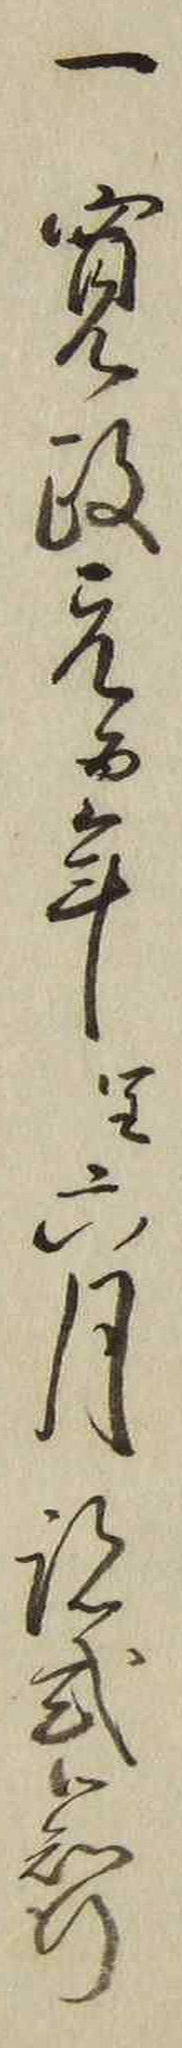一寛政元年酉年閏六月跡式御知行

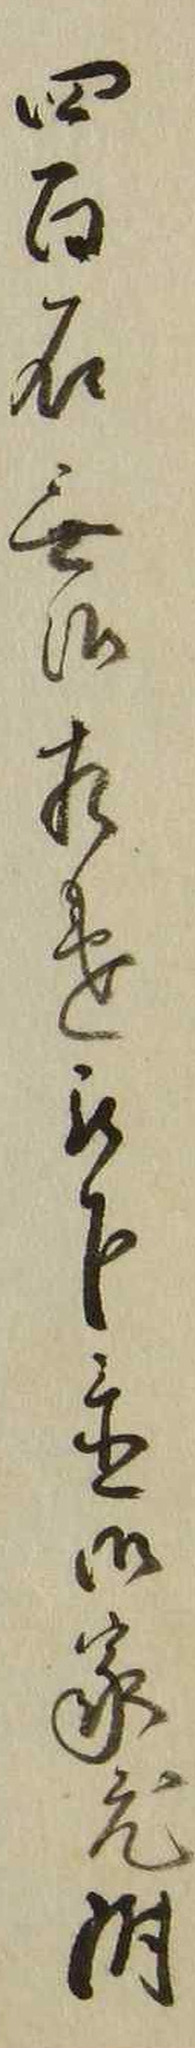四百石無相違被下置御家老付
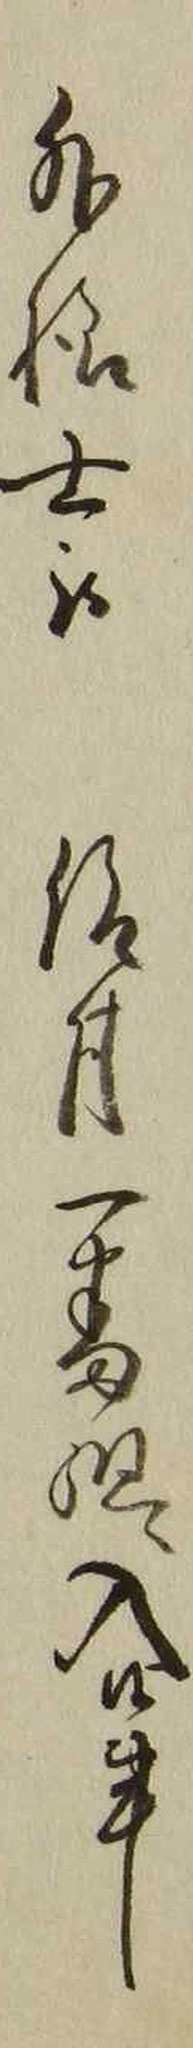外様士被仰付一番組へ入候事
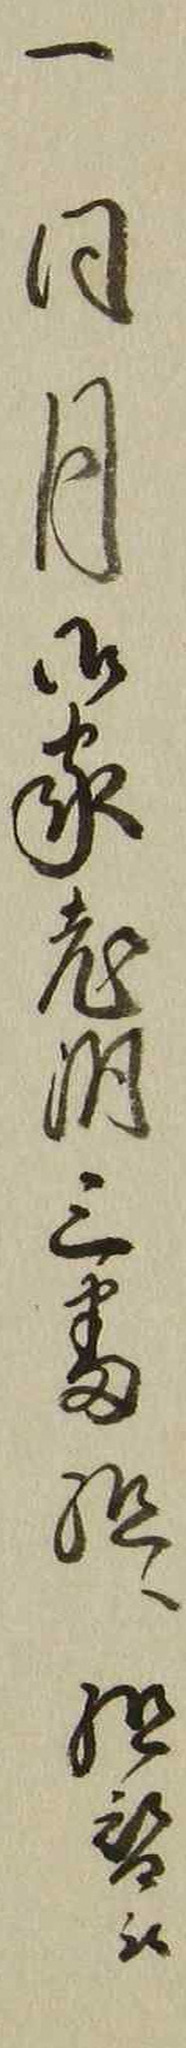一同月御家老付三番組へ組替被
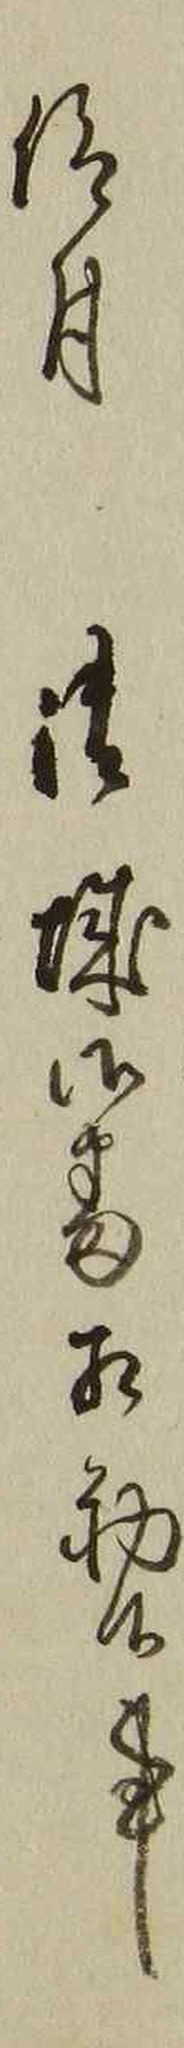仰付御城御番相勤候事
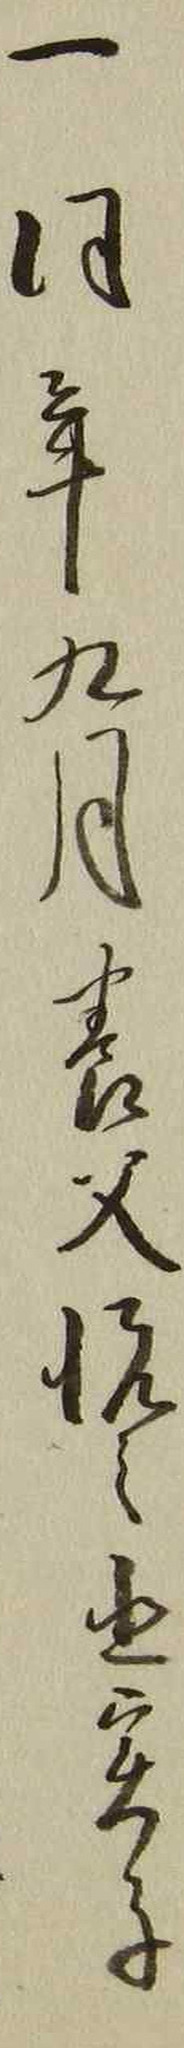一同年九月養父悦之丞実子
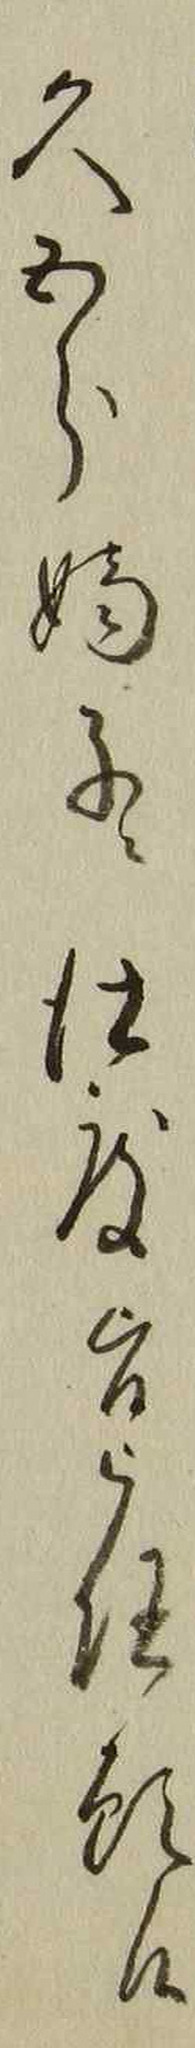久五郎嫡子ニ仕度旨任願候
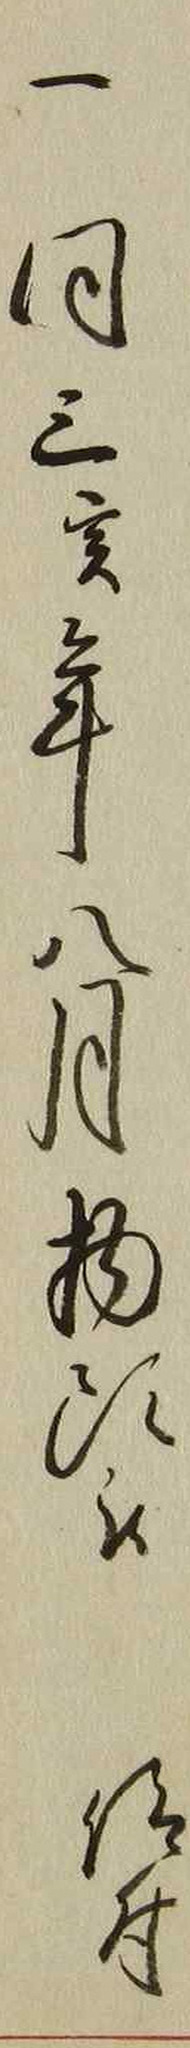一同三亥年八月物頭被仰付
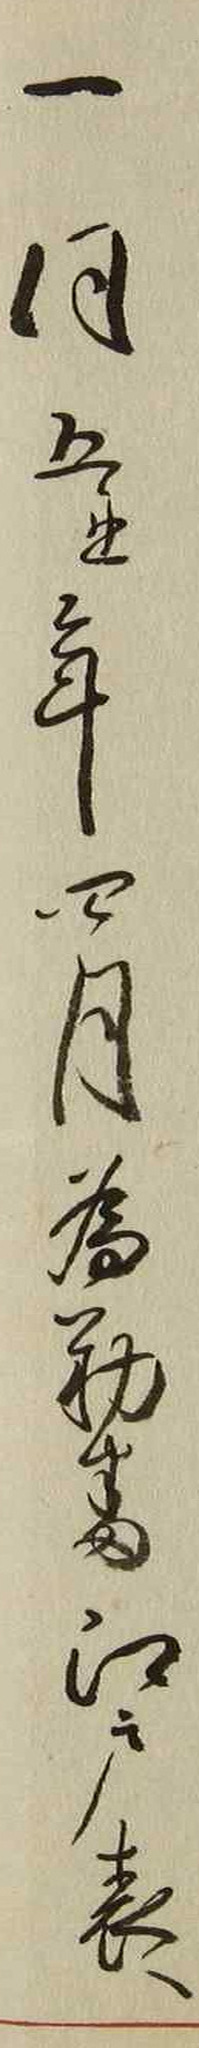一同五丑年四月為勤番江戸表へ
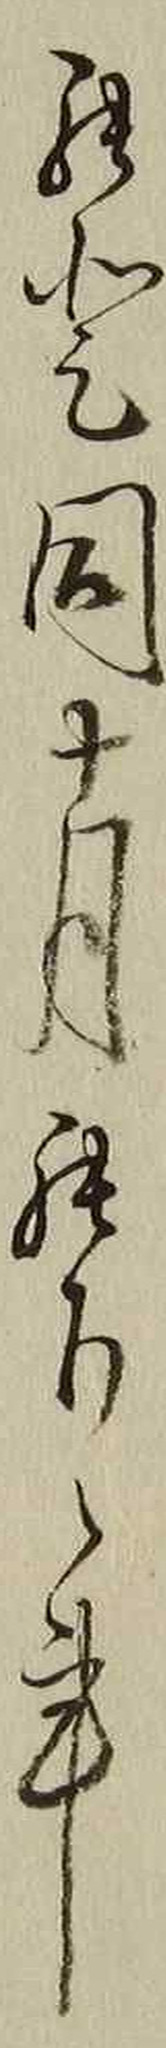罷登同十月罷下候事
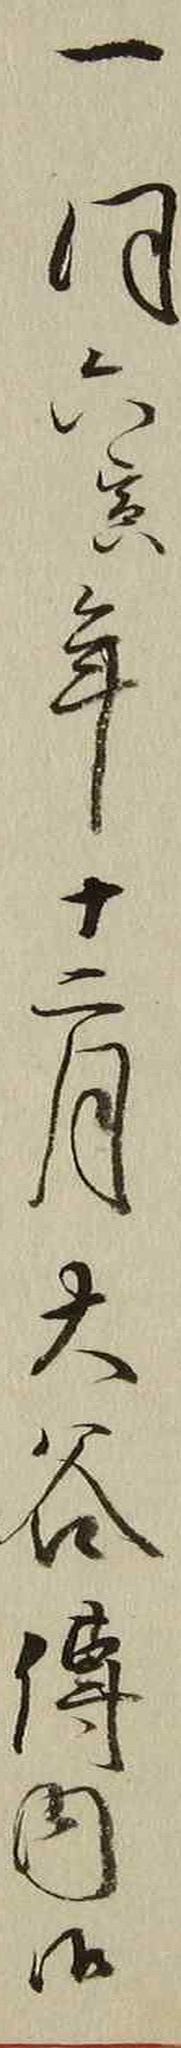一同六寅年十二月大谷伝内御
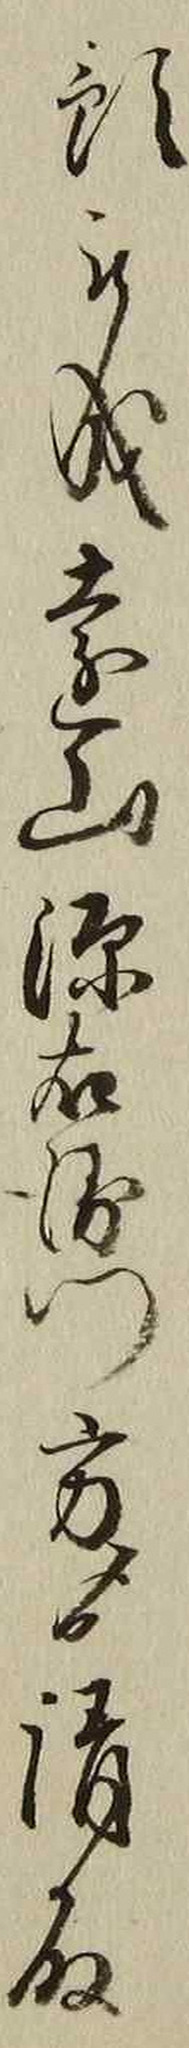預被成遠山源右衛門方ゟ請取
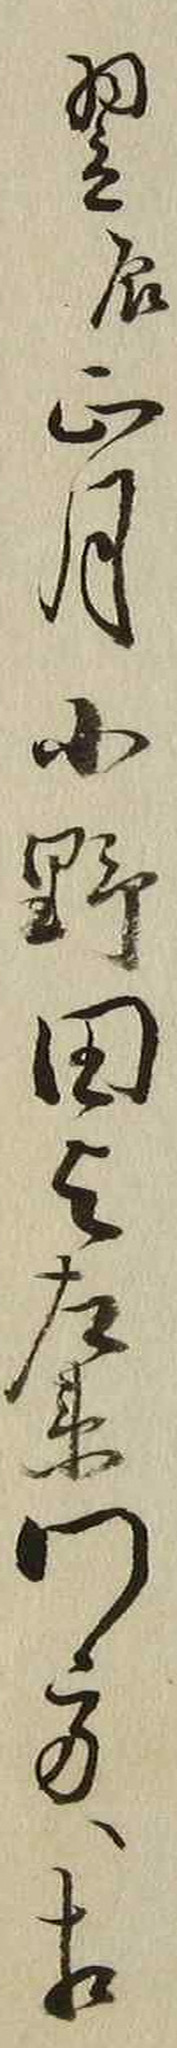翌辰正月小野田与左衛門方へ相
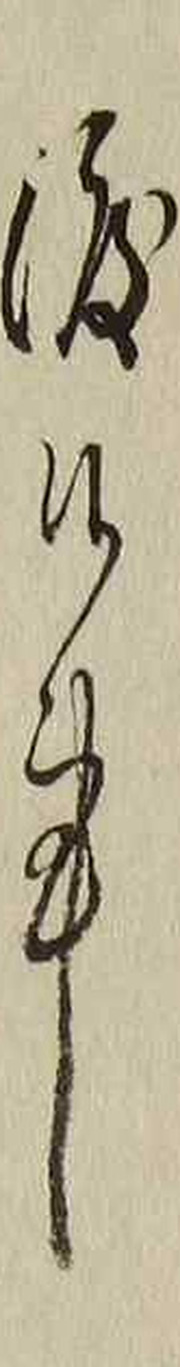渡候事
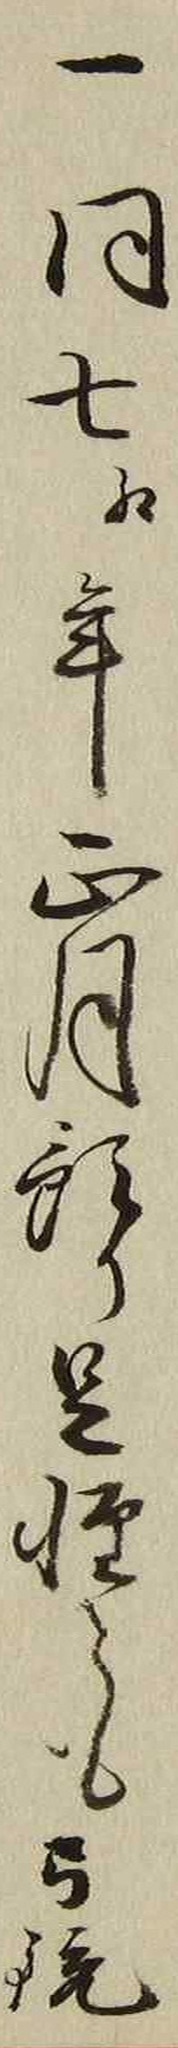一同七卯年正月預り足軽とも弓銃
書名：諸士系譜　巻之1　い之部1
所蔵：会津若松市立会津図書館
